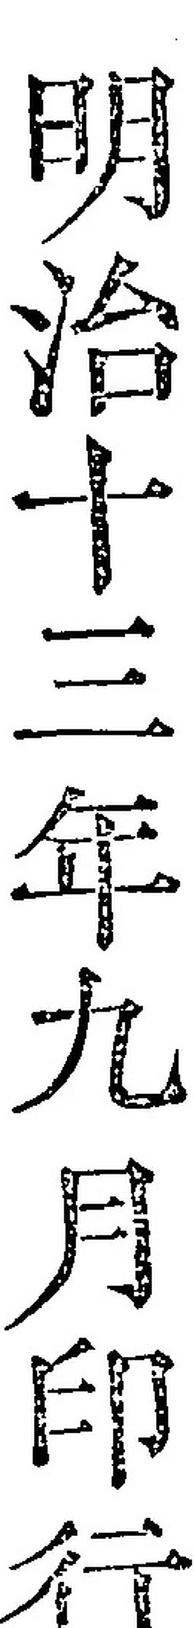明治十三年九月印行
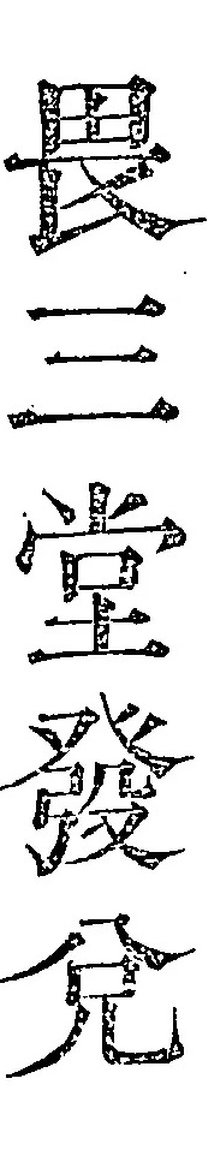畏三堂發兌

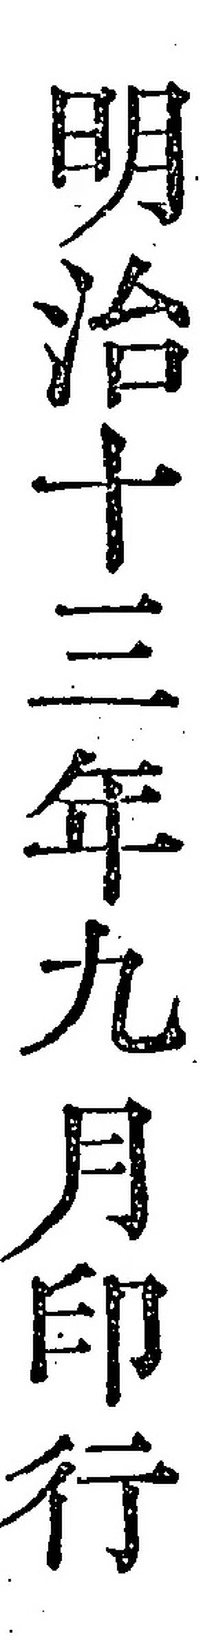明治十三年九月印行
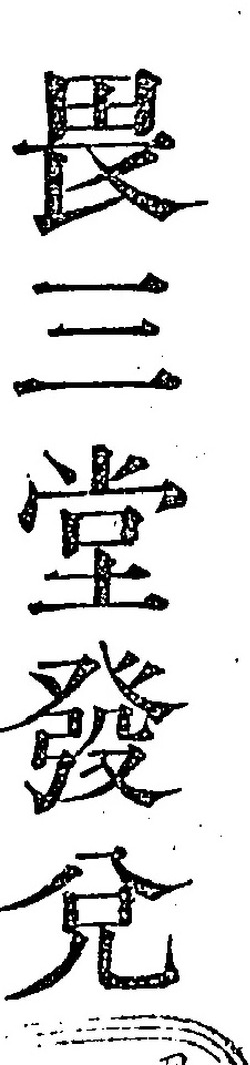畏三堂發兌

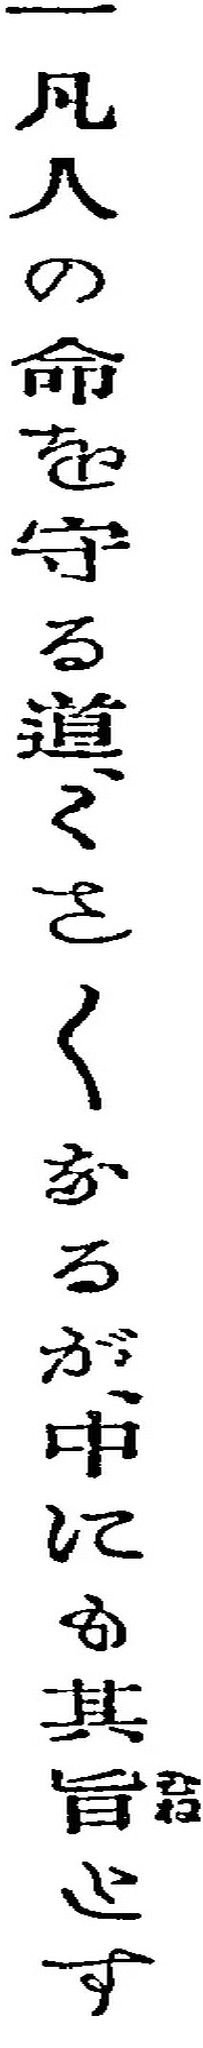一凡人の命を守る道、くさ〳〵なるが、中にも其旨とす
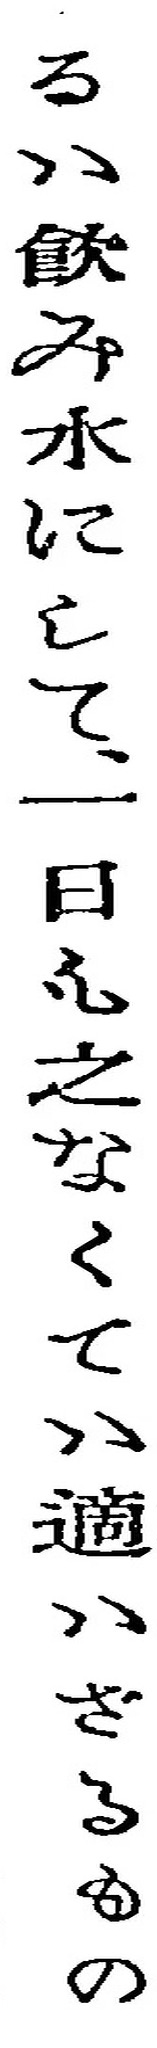るは飲み水にして、一日も之なくては適はざるもの
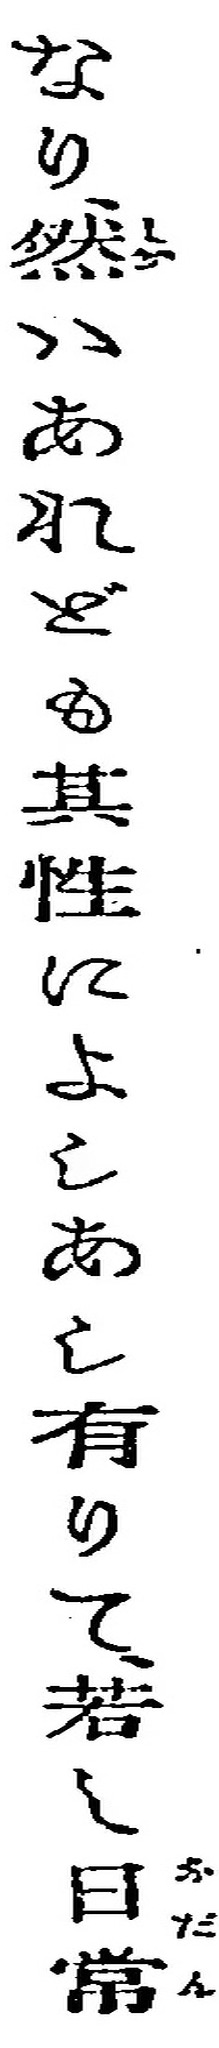なり、然はあれども其性によしあし有りて、若し日常
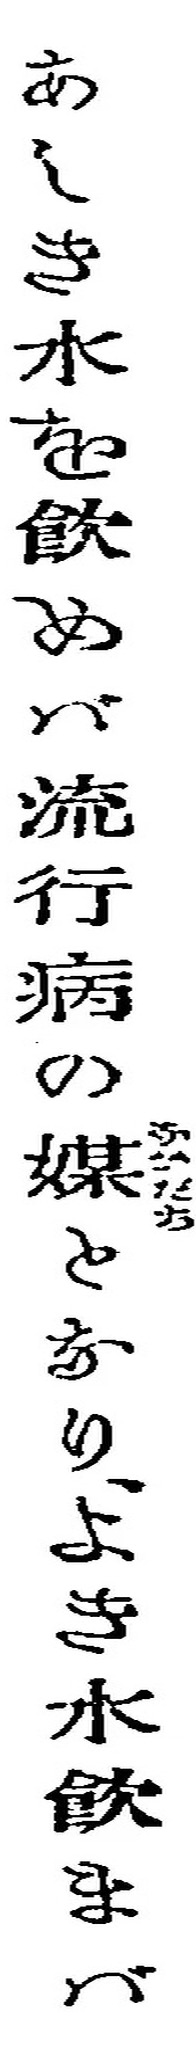あしき水を飲めば流行病の媒となり、よき水飲めば
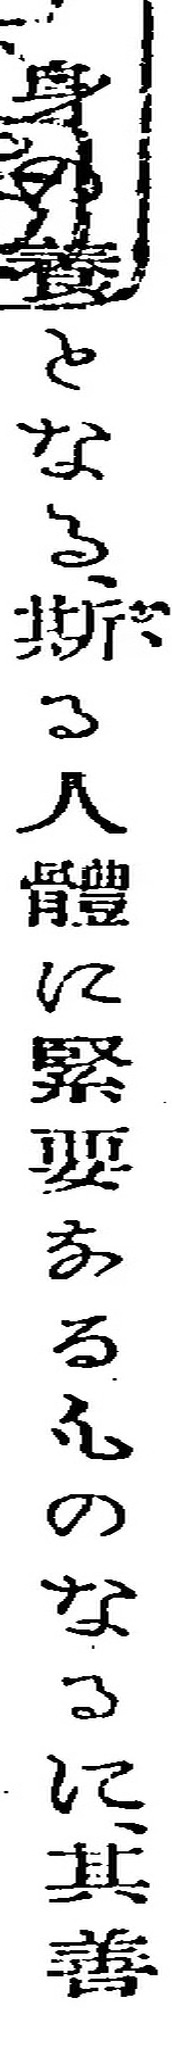身の養となる、斯る人体に緊要るものなるに、其善
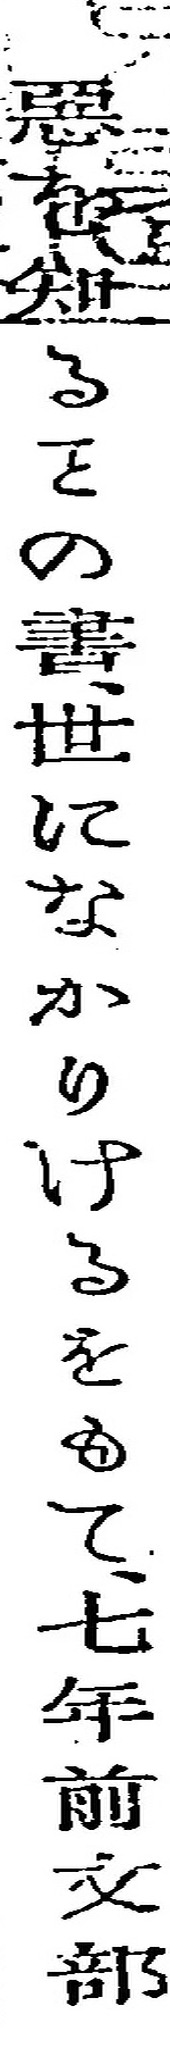悪を知ることの書、世になかりけるをもて、七年前文部
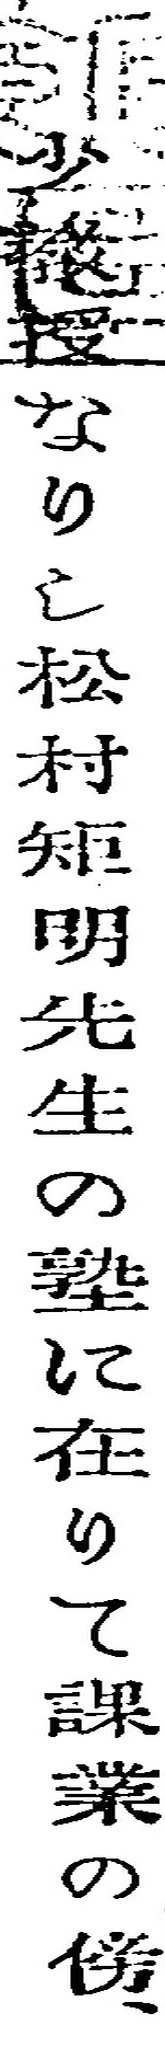少教授なりし松村矩明先生塾に在りて課業の傍、
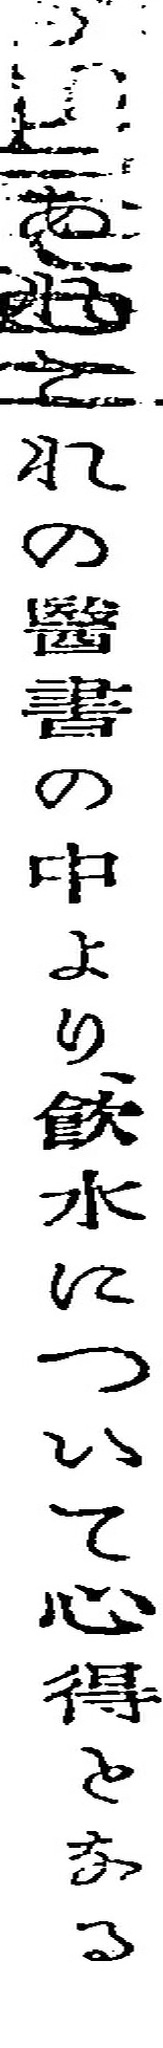あれこれの醫書の中より、飲水について心得となる
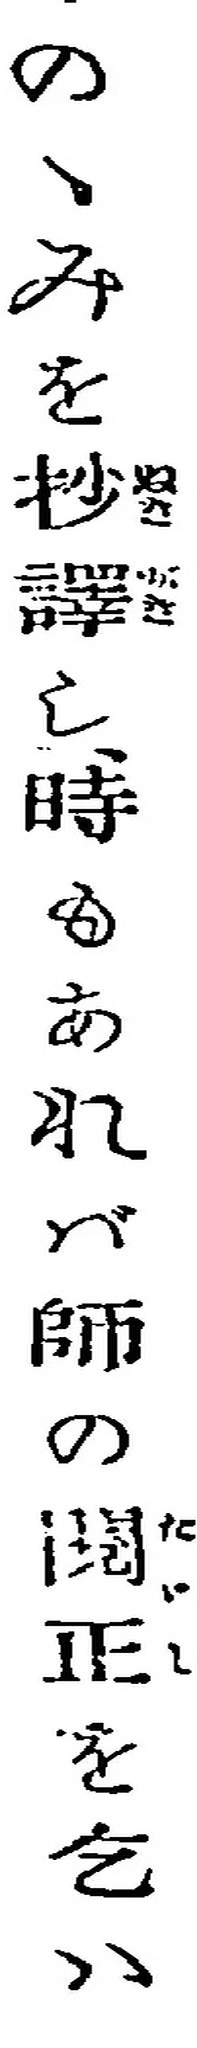べきものゝみを抄譯し、時もあれば師の閲正を乞は

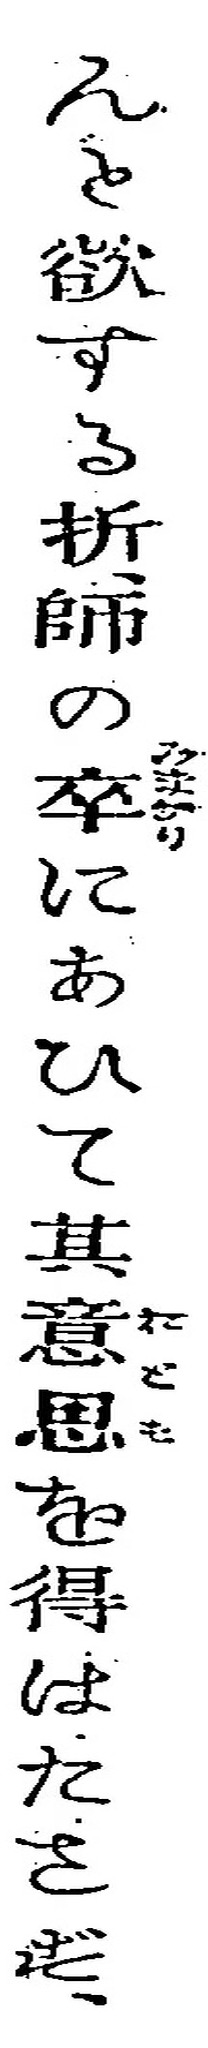んと欲する折、師の卒にあひて其意思を得はたさず、
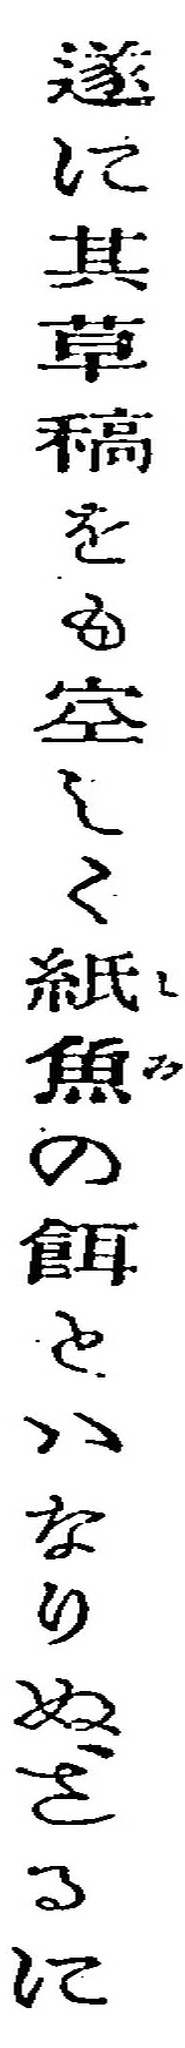遂に其草稿を空しく紙魚の餌とはなりぬ、さるに
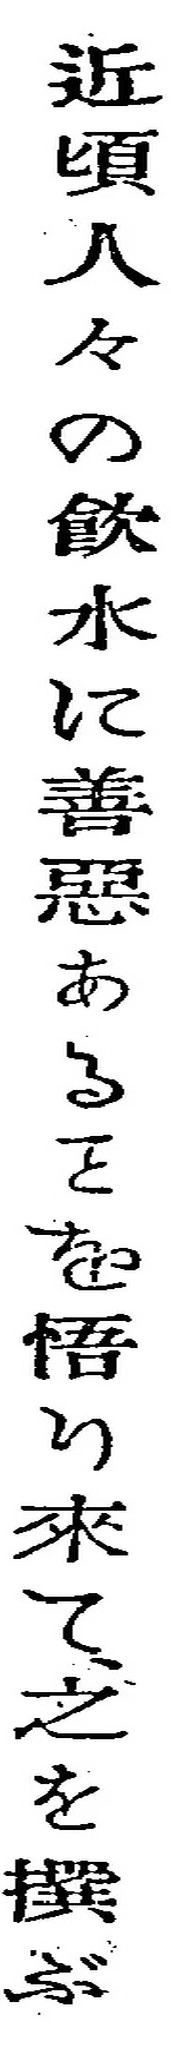近頃人々の飲水に善悪あることを悟り来て、之を撰ぶ
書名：飲水の心得 : 伝染病の予防
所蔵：国立国会図書館 National Diet Library, JAPAN
